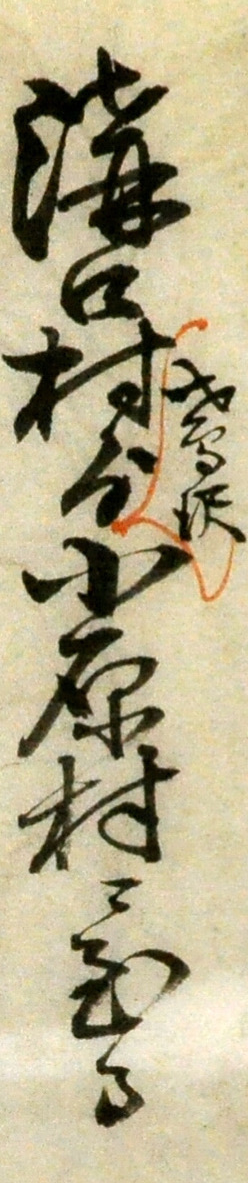溝口村ゟ鳶沢小原村ニ至る
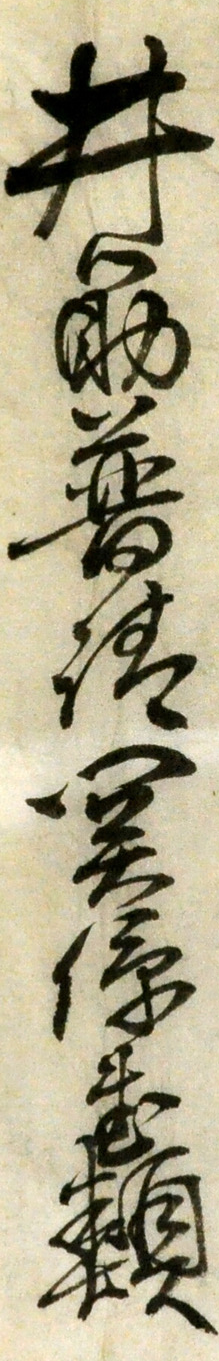井筋普請関係書類
